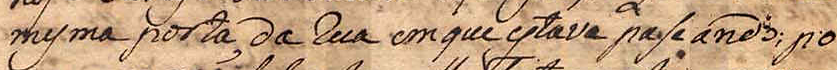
mesma porta da Rua em que estava paseando; po
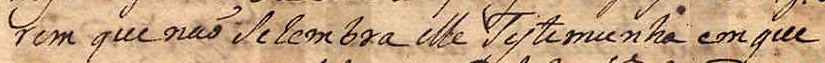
rem que naõ se lembra elle Testemunha em que
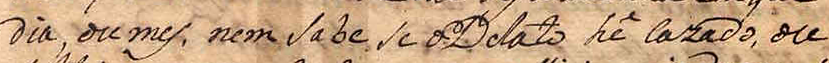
dia, ou mes, nem sabe se o Delato hé cazado, ou
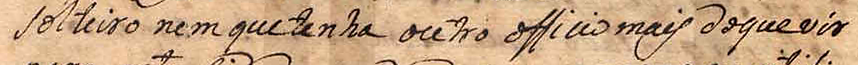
solteiro nem que tenha outro officio mais do que vir
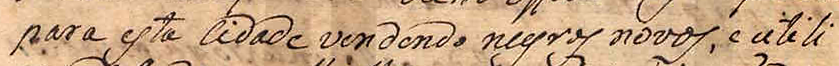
para esta cidade vendendo negros novos, e utili
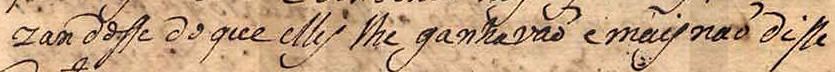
zandosse do que elles lhe ganhavão e mais naõ disse
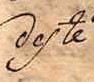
deste
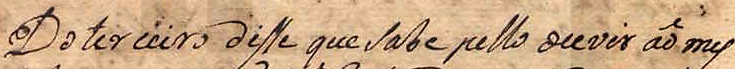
Do terceiro disse que sabe pello ouvir ao mes
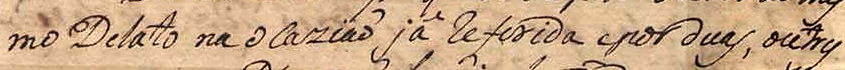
mo Delato na ocaziaõ já Referida e por duas, ou tres
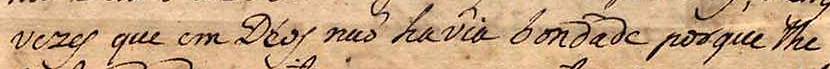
vezes que em Deos naõ havia bondade porque lhe
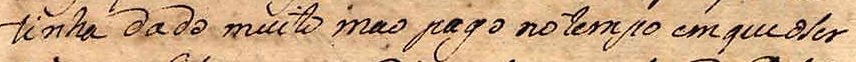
tinha dado muito mao pago no tempo em que o ser
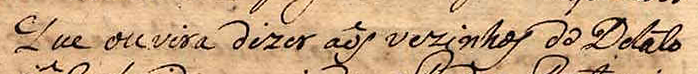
Que ouvira dizer aos vezinhos do Delato
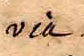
via.
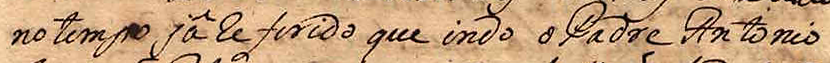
no tempo já Referido que indo o Padre Antonio
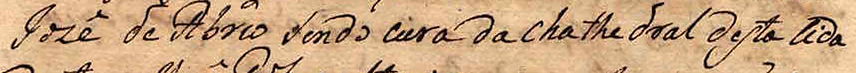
Iozé de Abreo sendo cura da chathedral desta Cida
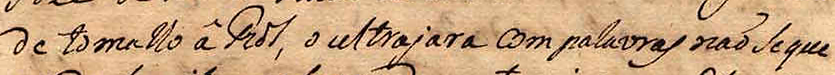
de tomallo á Rol, o ultrajara com palavras naõ se que
